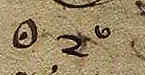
O 2o
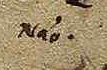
Naõ.
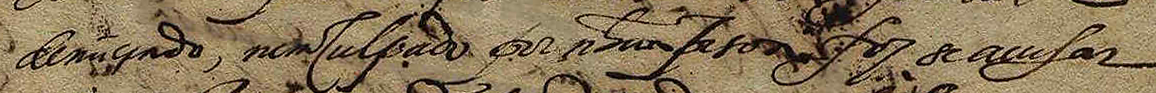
denūcjado, nem Culpado por nhuā pesoa foj se acusar
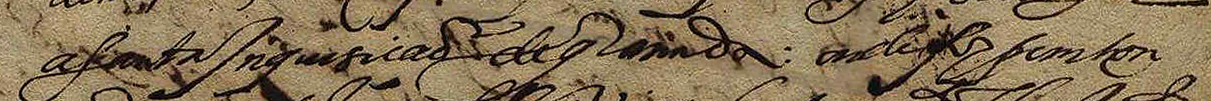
a santa Jnquisiçaõ de granada: onde foi peniten
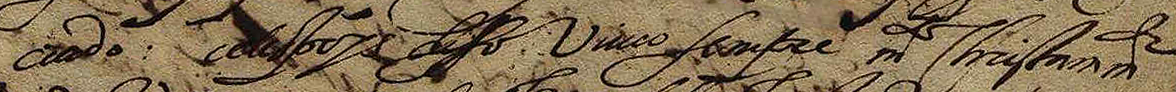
ciado: e despojs disso Viueo sempre mto Christammte
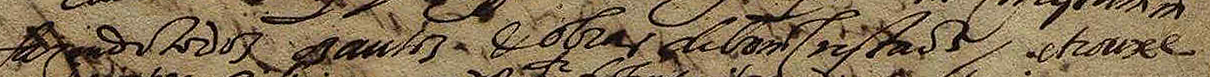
fazendo todos autos & obras de bom Cristaõ/ e trouxe
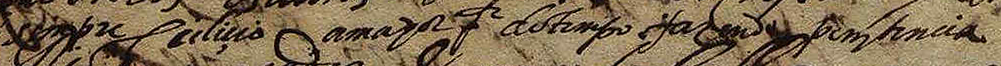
sempre cilicio a mayor pte do tempo fazendo penjtencia
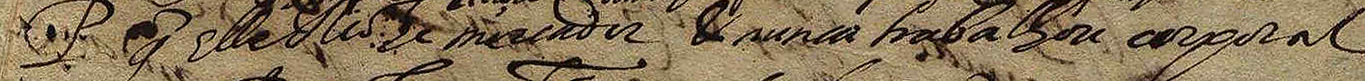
P q̄ Elle Reo he mercador & nunca trabalhou corporal
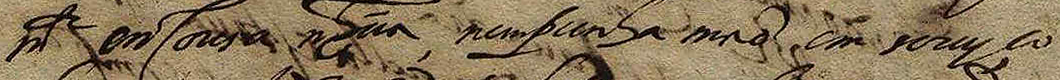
mte en Cousa nhūa, nem punha maõ em serujço
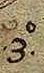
3o
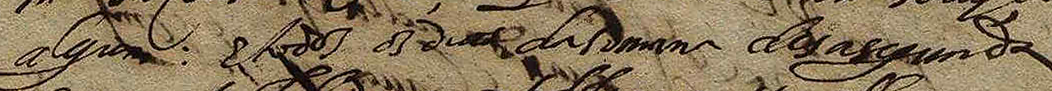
algum: E todos os dias da somana des a segunda
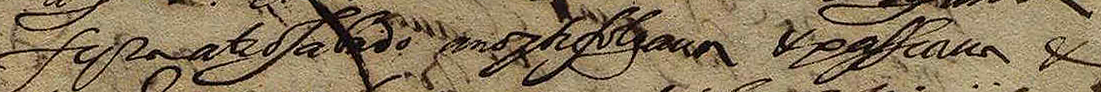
fejra ate o sabado a nojte folgaua & passeaua &
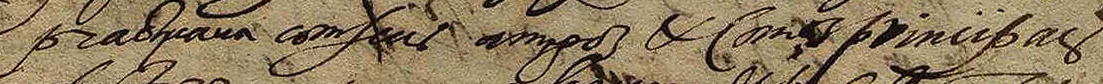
practjcaua com seus amigos & Com os principaes
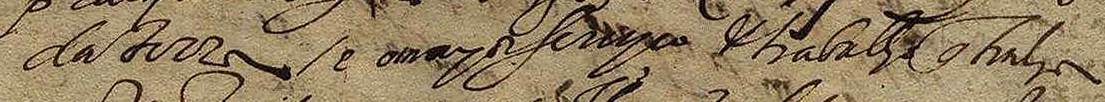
da terra / e o mayor serujço & trabalho q̄ tinha
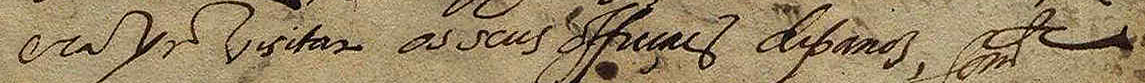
era yr visitar os seus officiaes de panos, somte
